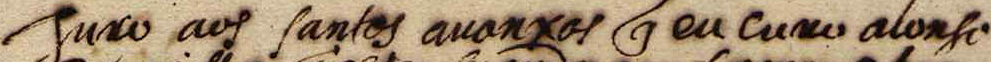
juro aos santos auanxos q̄ eu curo alonso
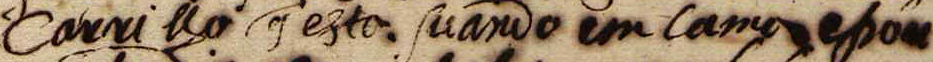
Carrillo q̄ esta suando em cama e por
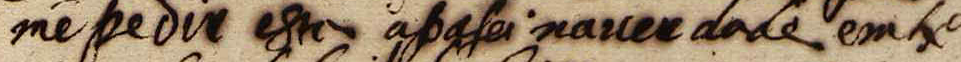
me pedir esta a pasei na uerdade em lxa
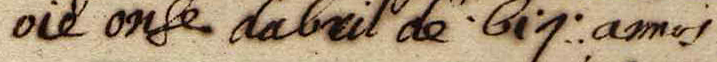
oie onse dabril de .617. annos
